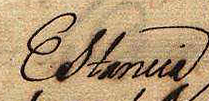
Estancia
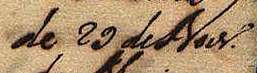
de 29 de Novr.o
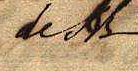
de M
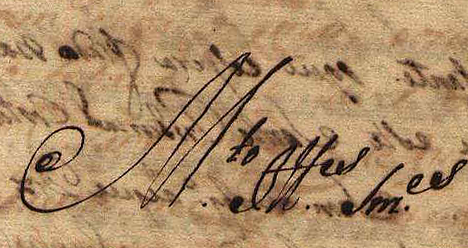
M.to Ill̄.es Snr.es
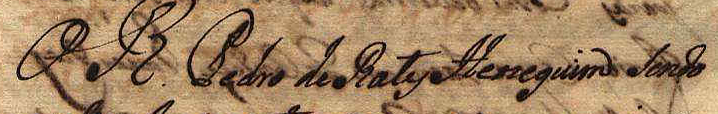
O R. Pedro de Rates Henequim sendo
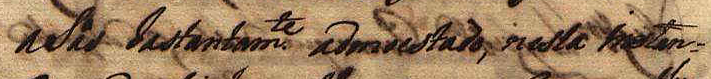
aSás bastantem.te admoestado, nesta Instan
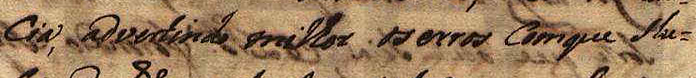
Cia, advertindo milhor os erros Com que Ilu
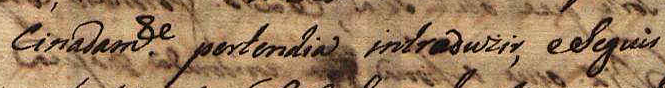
Cinadam.te pertendia introduzir, e Seguir
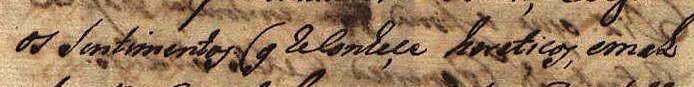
os sentimentos q̄ Reconhece hereticos, e mal
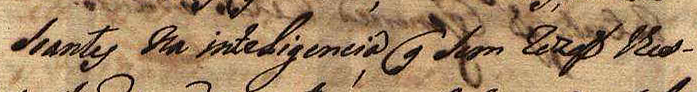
soantes na inteligencia q̄ sem Rezaõ lhes
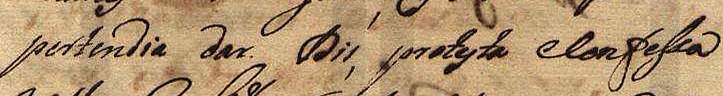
pertendia dar. Dis, protesta e confessa
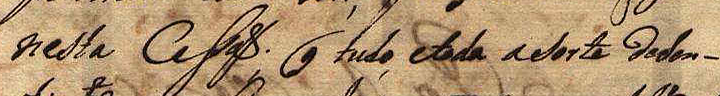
nesta Cessaõ. q̄ tudo, e toda a sorte de sen
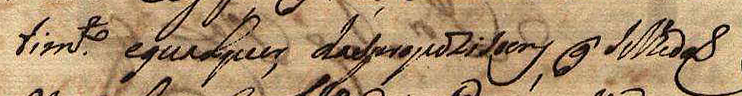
tim.to e qualquer, das propozisoens, q̄ se lhe daõ
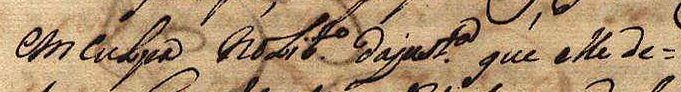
em culpa no Lib.o da just.a que elle de
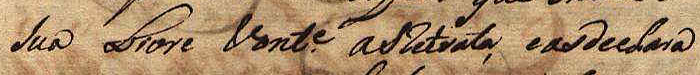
sua Livre Vont.e as Retrata, e as declara
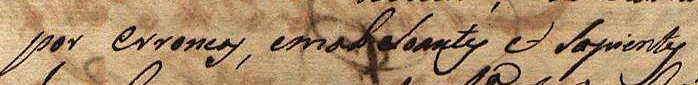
por erroneas, e malsoantes & sapientes
